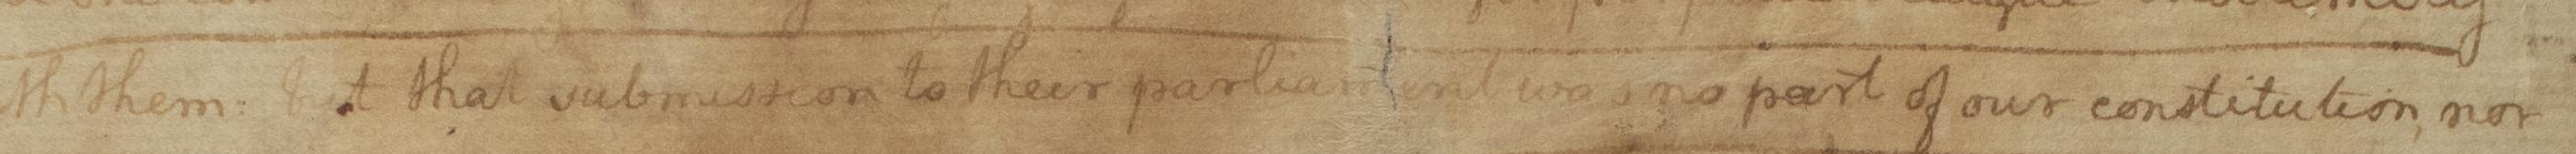with them but that submission to their parliament was no part of our constitution, nor
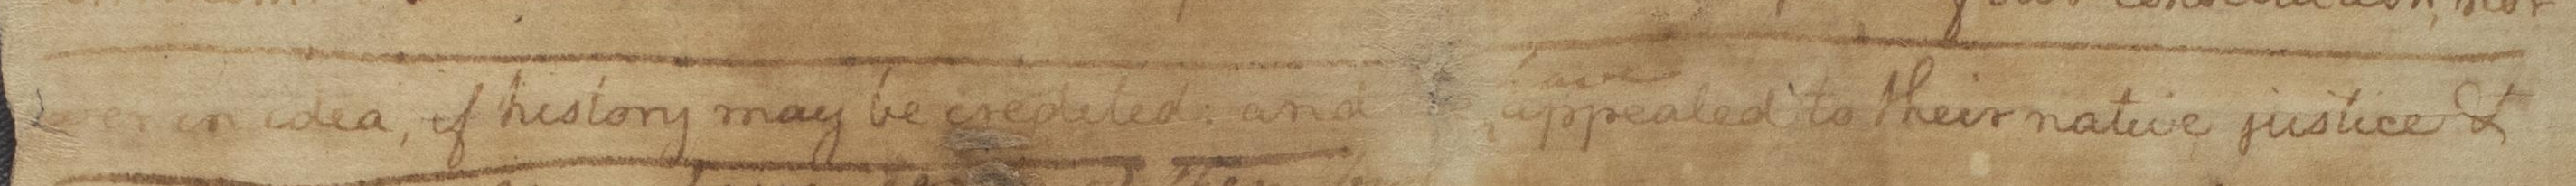ever in idea, if history may be credited and appealed to their native justice &
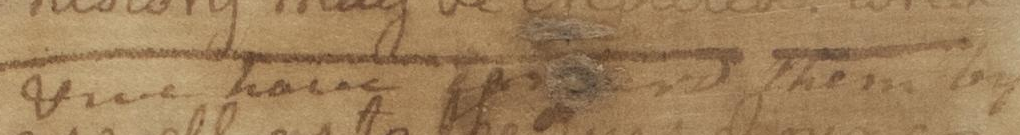if our have injured them by
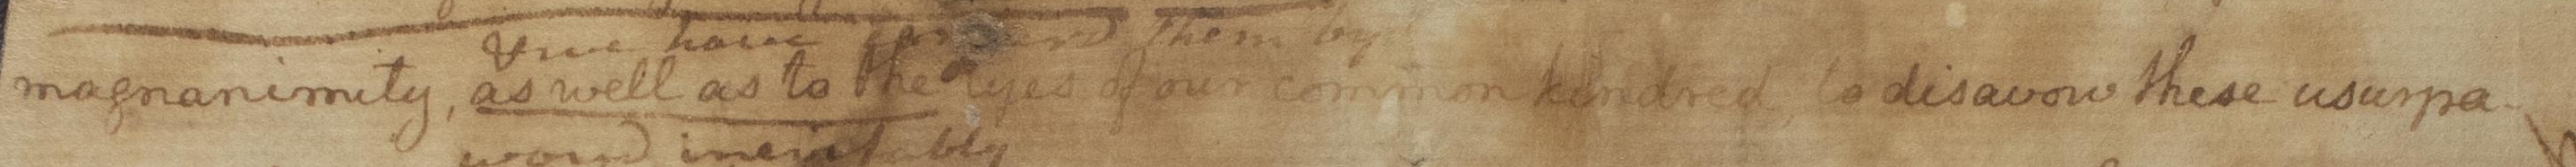magnanimity as well as to the Rises of your common kindred to disavow these usurpa-
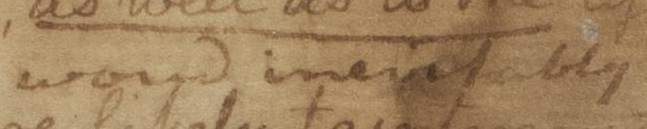would inevitably
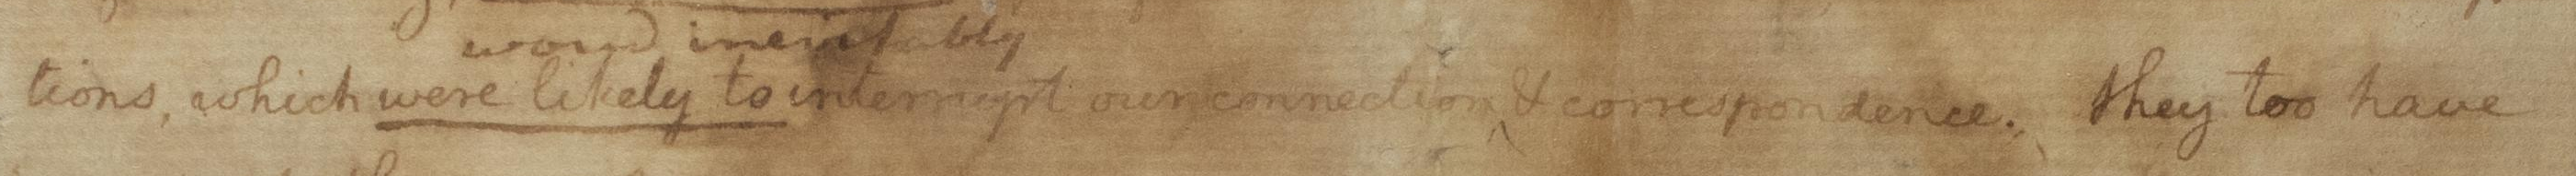-tions, which were likely to interrupt our connections & correspondence, they too have
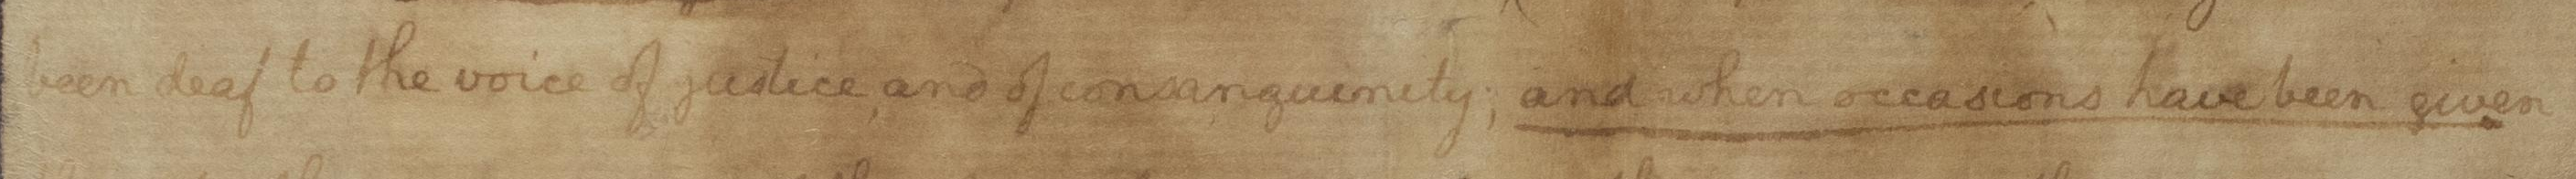been deaf to the voice of justice and of consanguinity and when occasions have been given
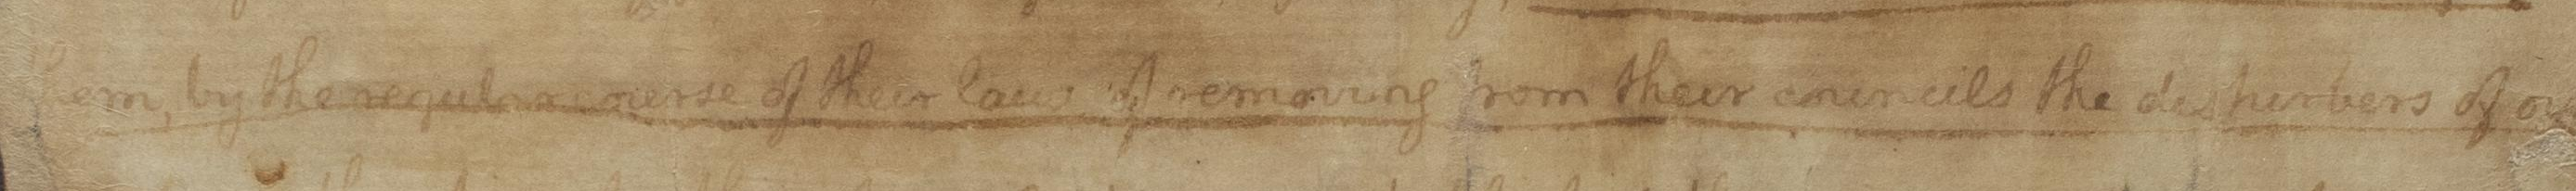then by the regular course of their laws of removing from their councils the disturbers of our
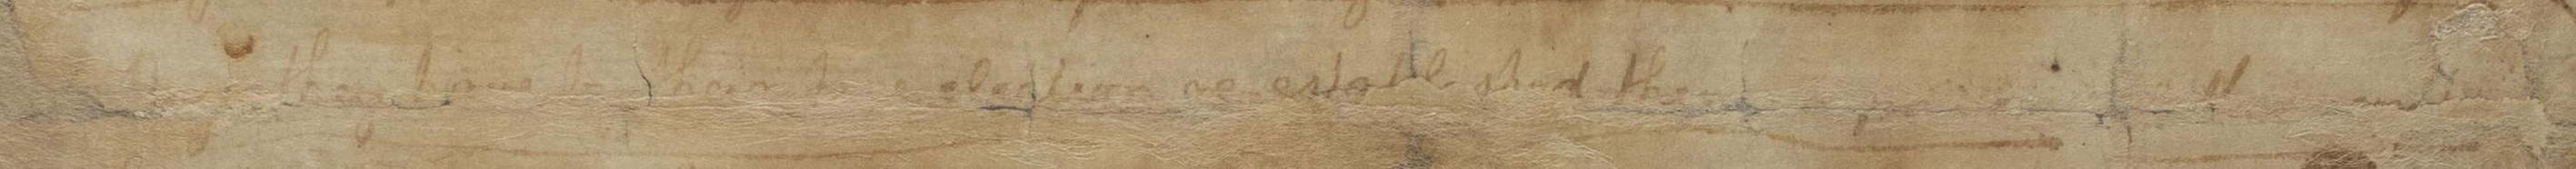harmony, they have by their free election re-established them in power. at this very time
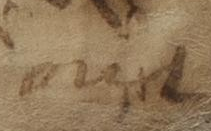overt
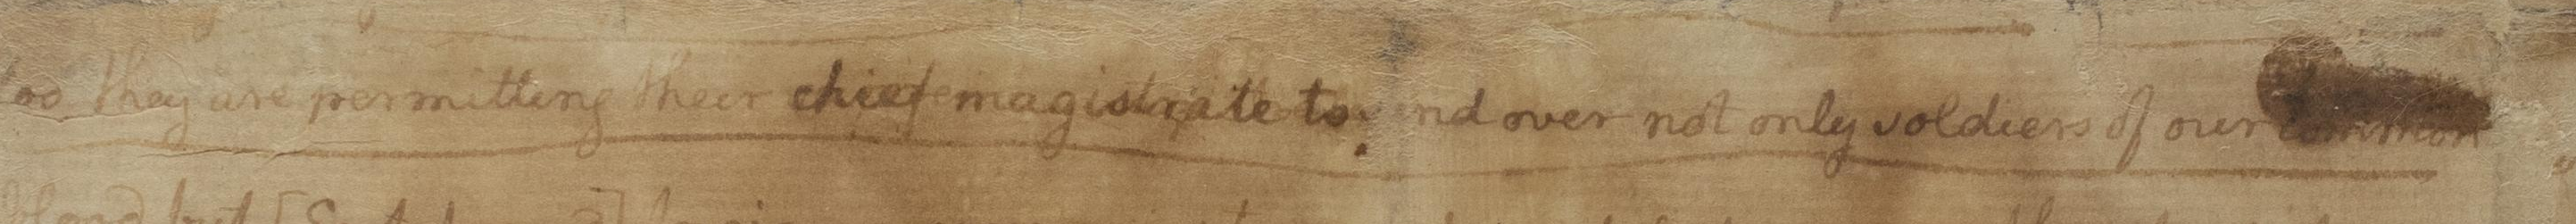too they are permitting their chief magistrate to and over not only soldiers of our Common
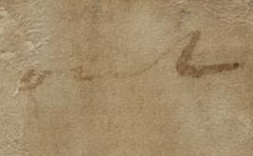out
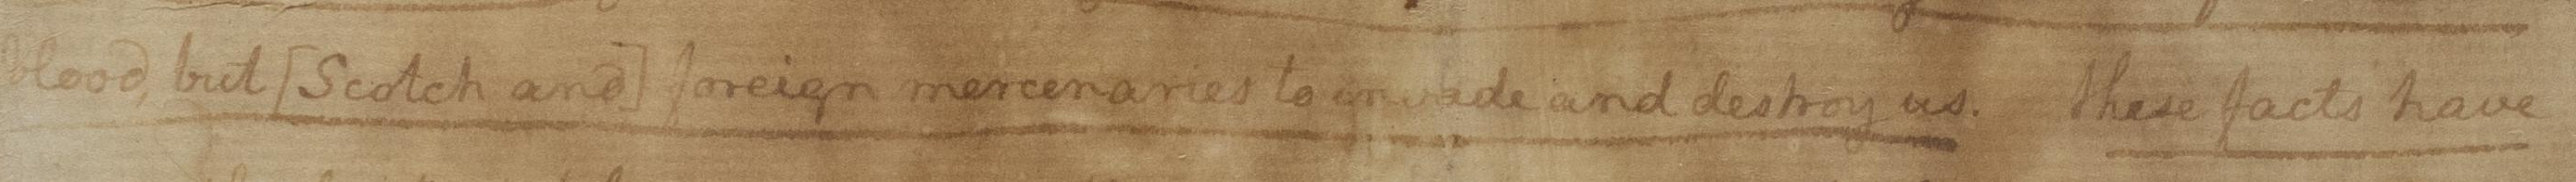blood but (Scotch and) foreign mercenaries to invade and destroy us. these facts have
